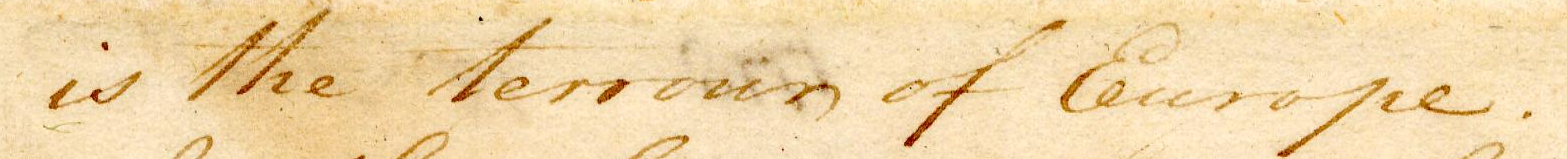is the terrain of Europe
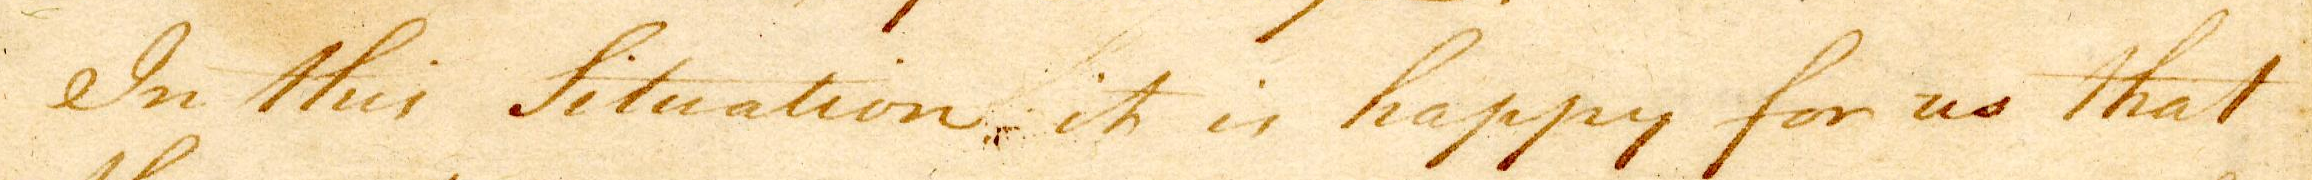In this Situation, it is happy for us that
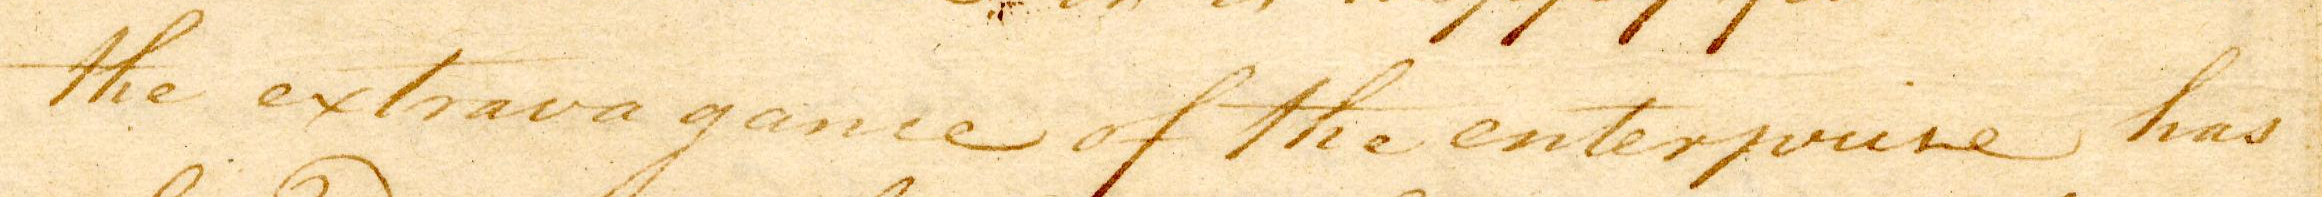the extravagance of the enterprise his
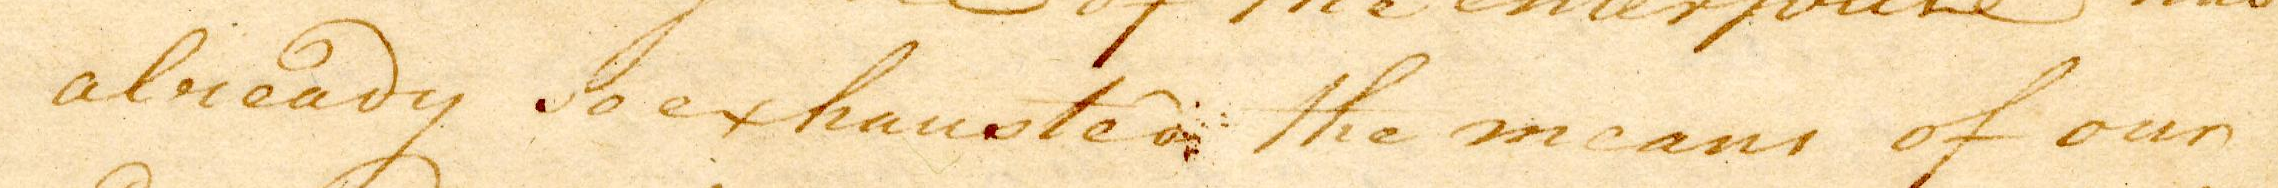already so exhausted the means of our
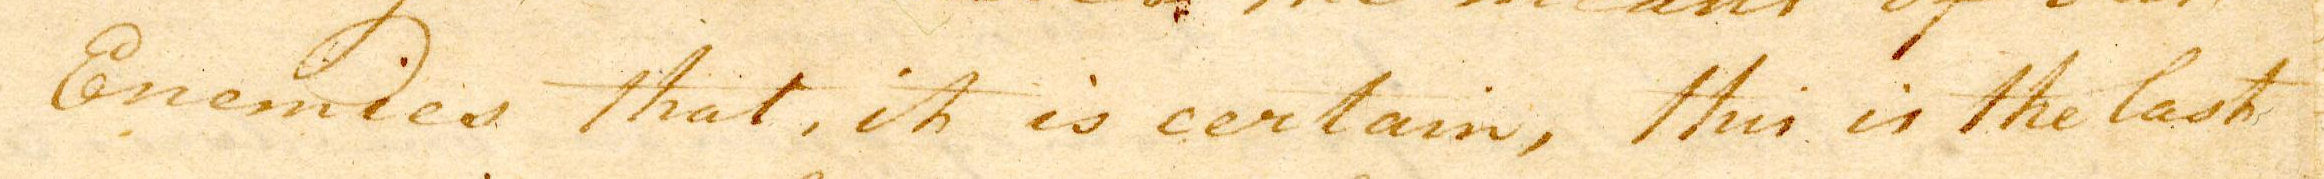Enemies that, it is certain, this is the last
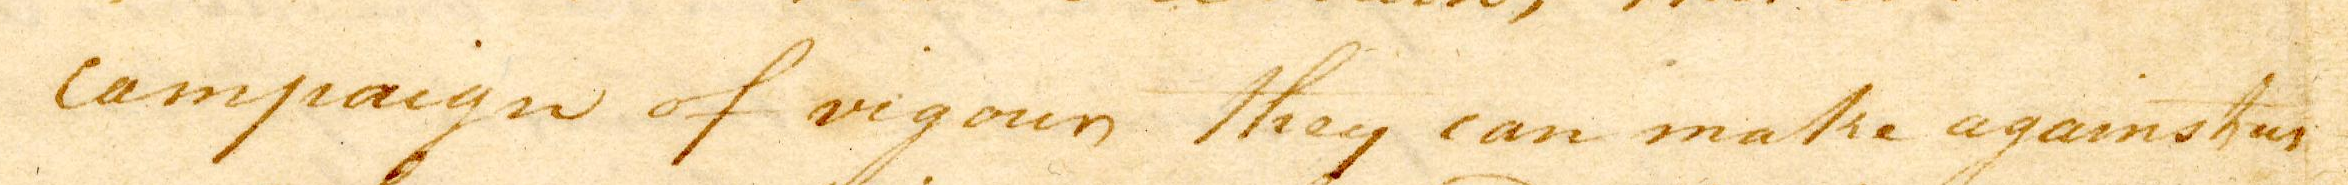campaign of vigour they can make against us
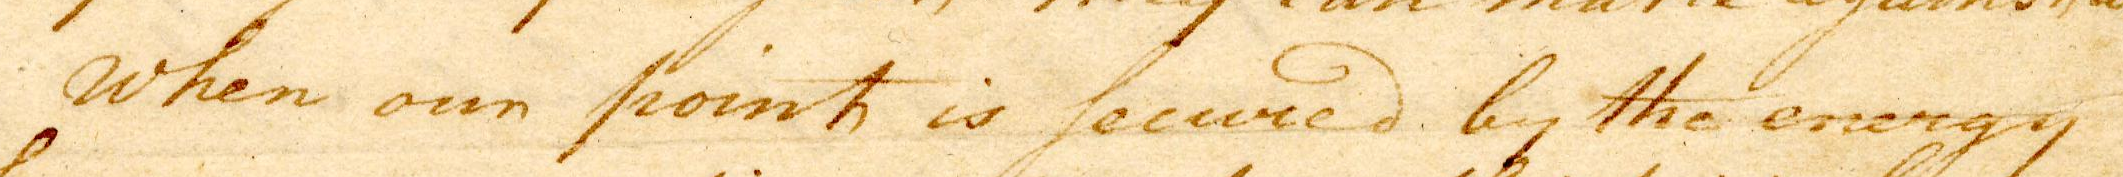when our point is secured by the energy
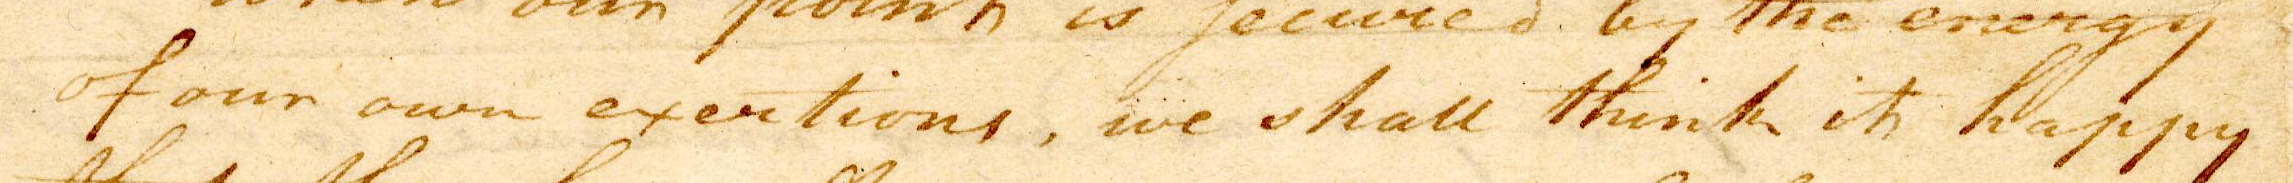of our own exertions, we shall think its happy
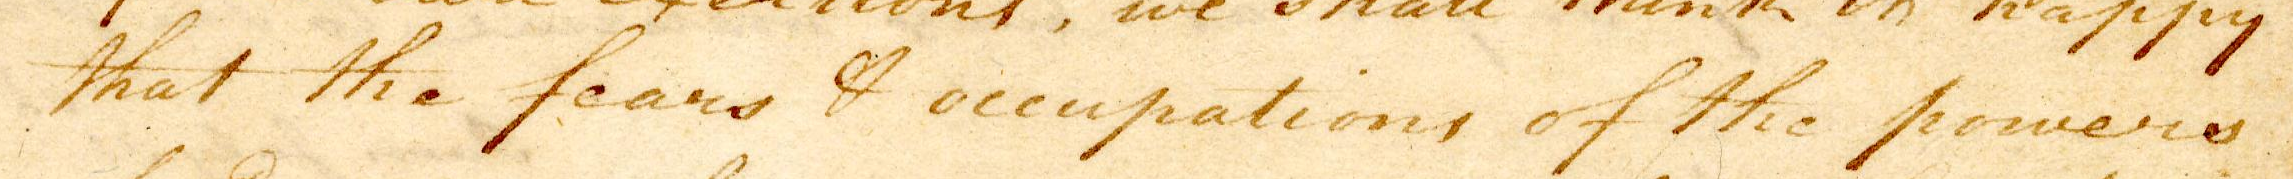that the fears & occupations of the powers
